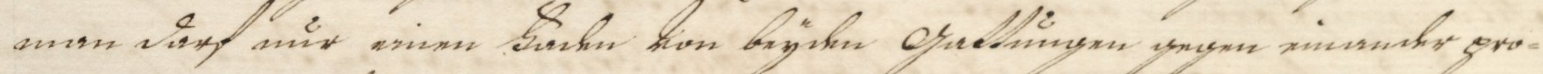man darf nur einen Faden von beyden Gattungen gegen einander pro-
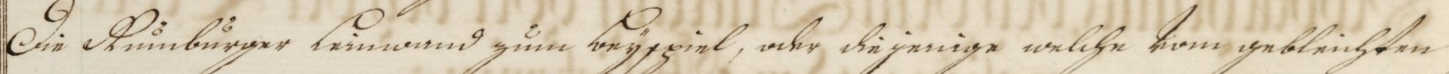Die Rumburger Leinwand zum Beyspiel, oder diejenige welche vom gebleichten
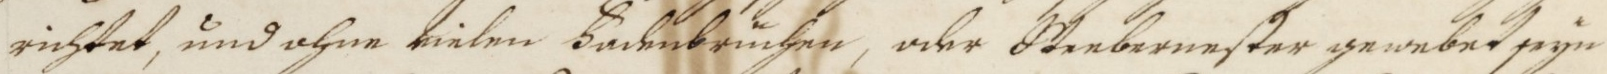richtet, und ohne vielen Fadenbrüchen, oder Weebernester gewebet seyn
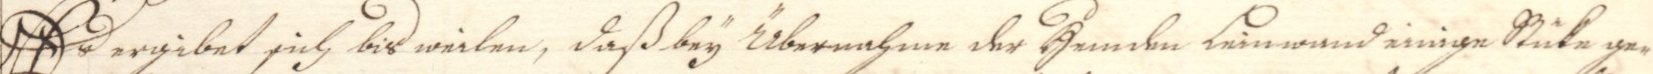Es ergibet sich bis weilen, daß bey Übernahme der Hemden Leinwand einige Stüke ge-
